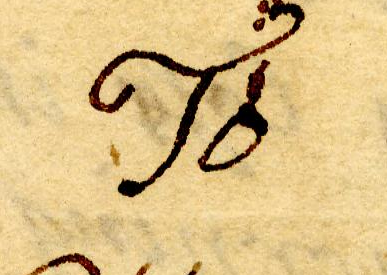To
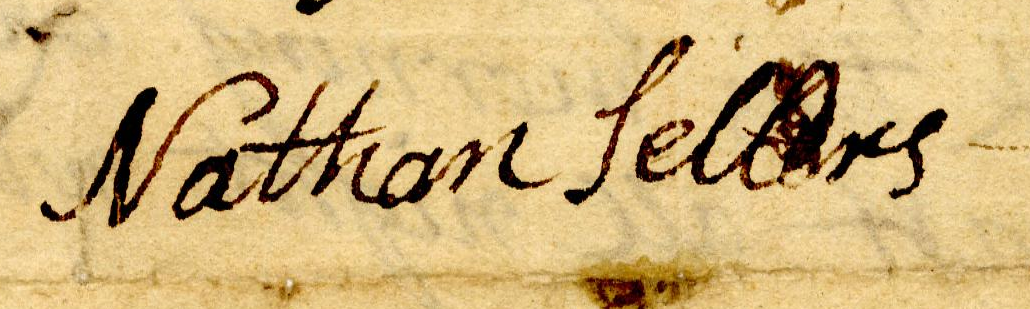Nathan Sellers
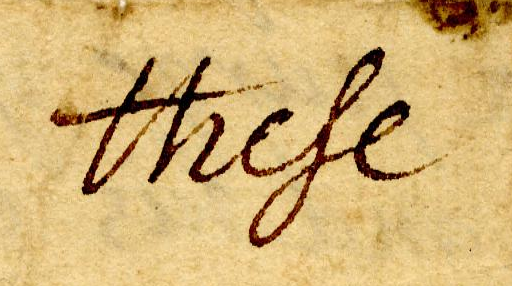these
